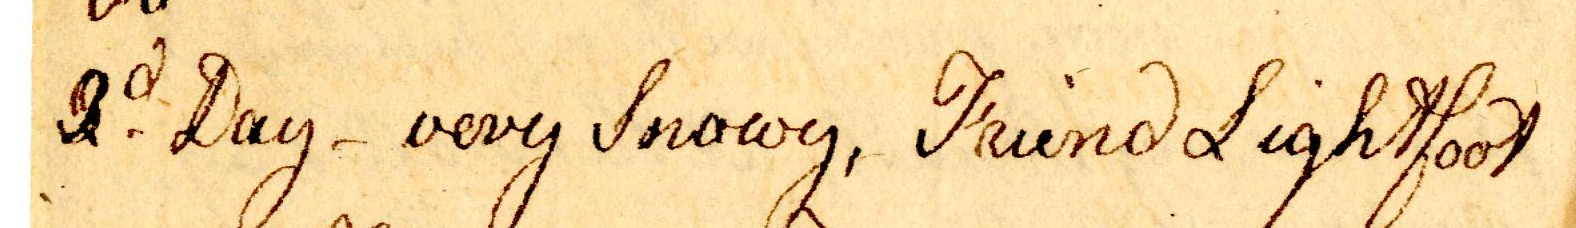3^d. Day- very Snowy, Friend Lightfoot
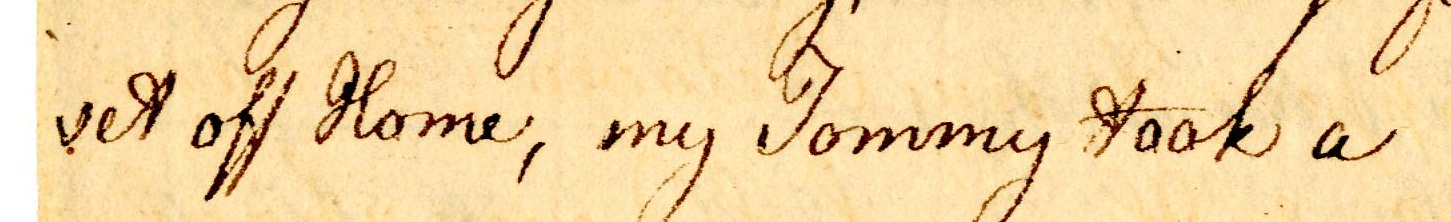set off Home, my Tommy took a
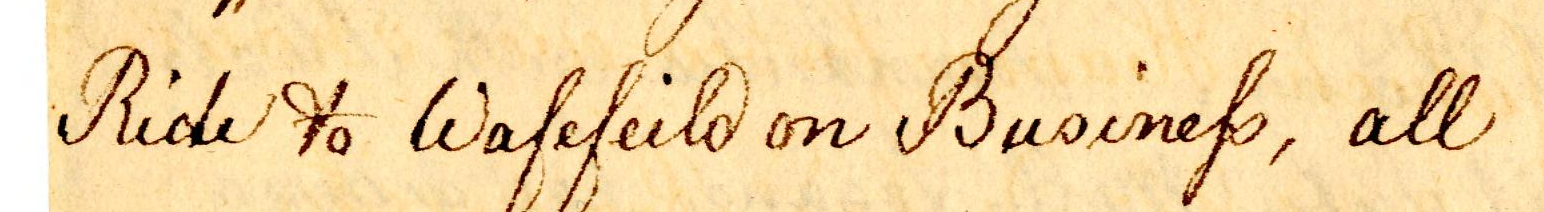Ride to Wafefeild on Business, all
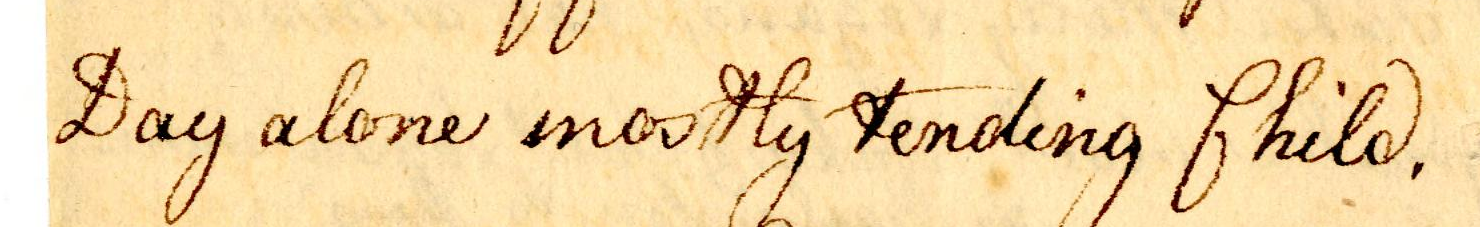Day alone mostly tending Child.
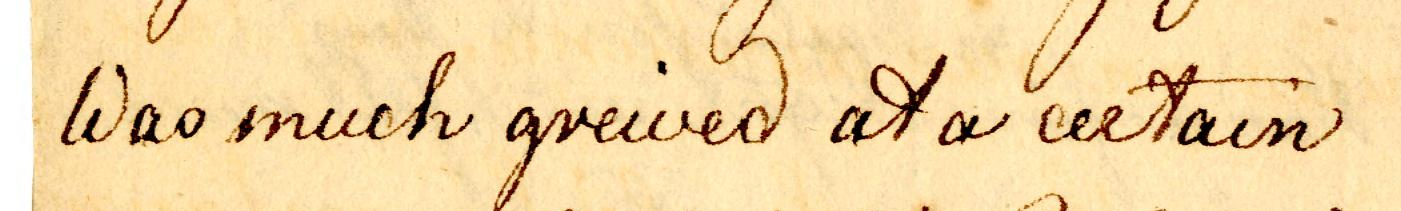Was much greived at a certain
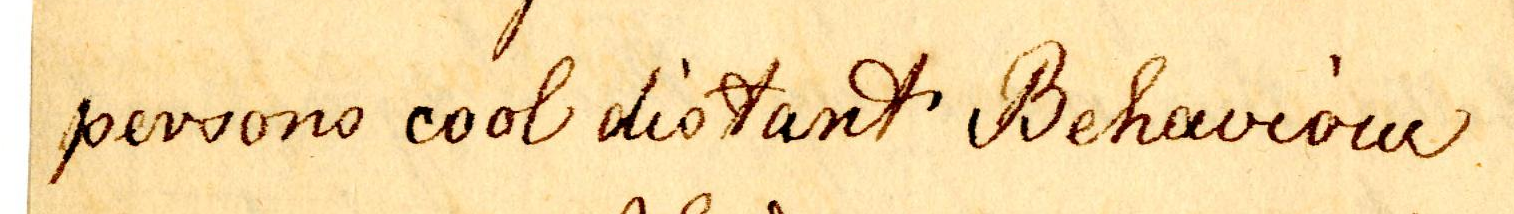persons cool distant Behaviour
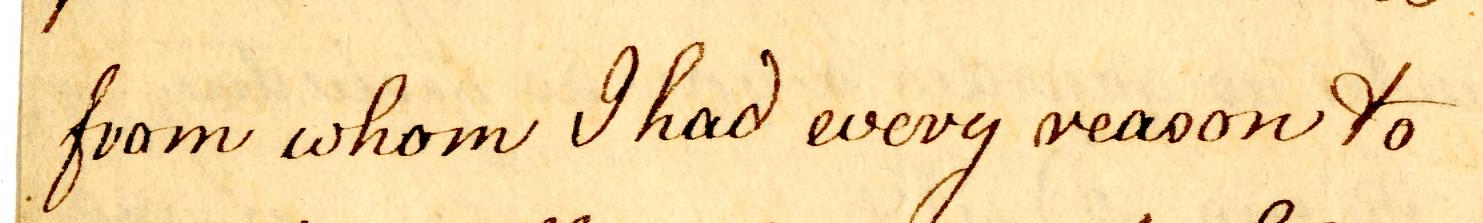from whom I had every reason to
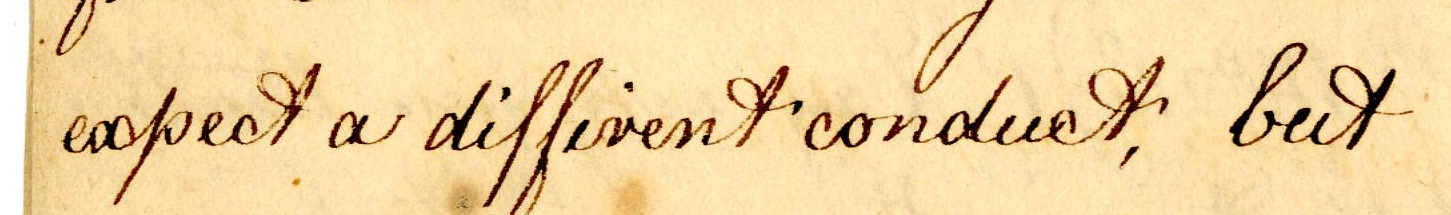expect a diffirent conduct, but
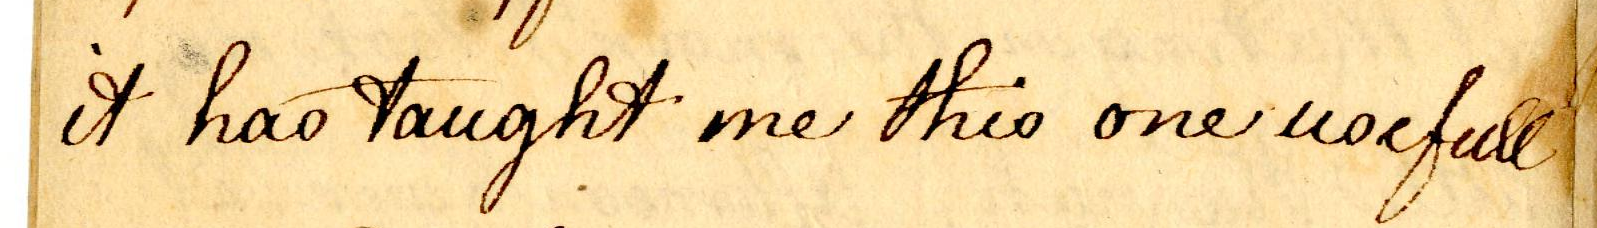it has taught me this one usefull
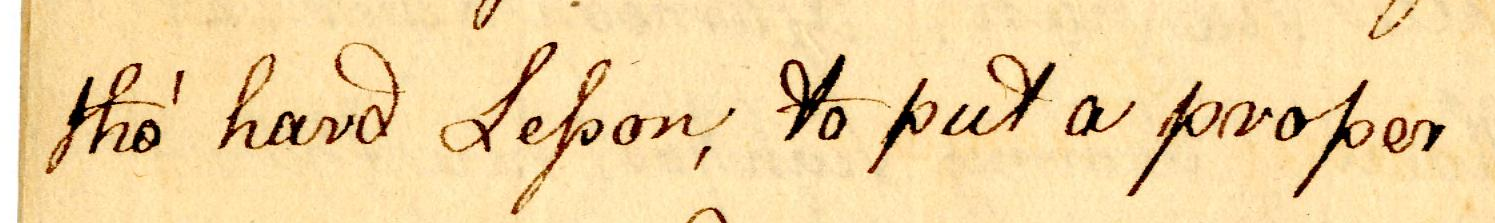tho' hard Lesson, to put a proper
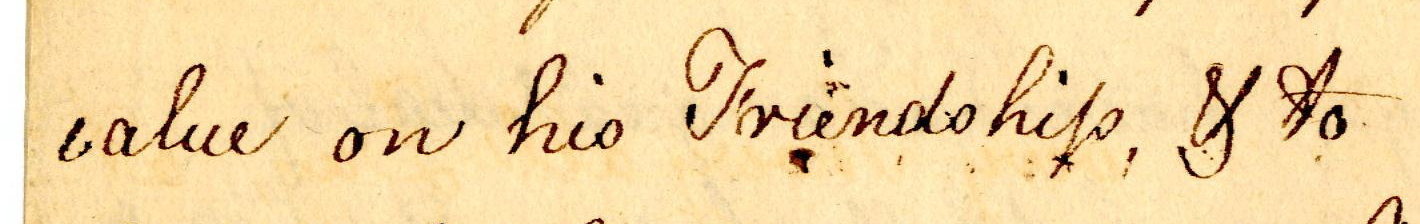value on his Friendship, & to
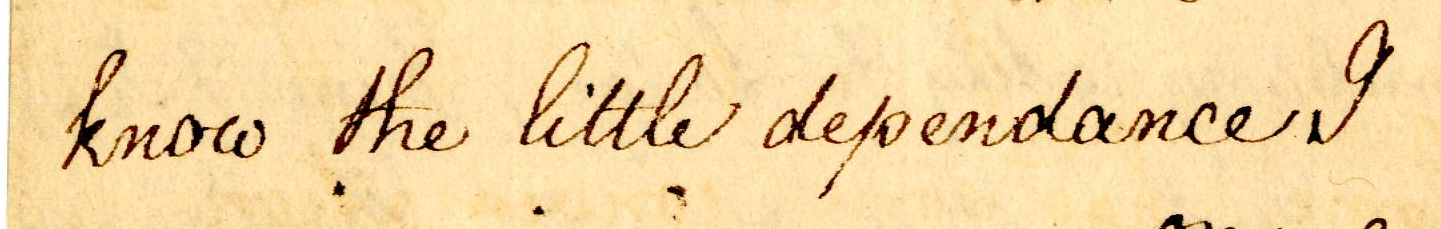know the little dependance I
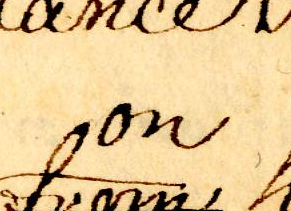on
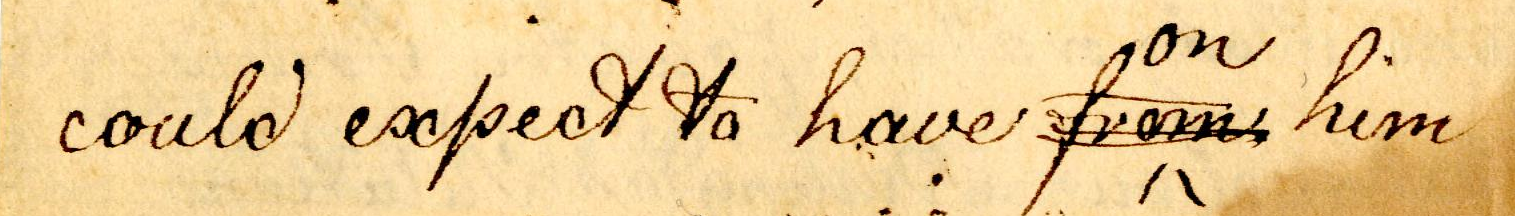could expect to have from ^ him
